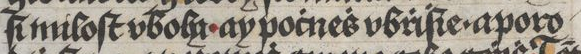ſi miloſt vboha.ay poċneš vbṙiẛie.a poro¬
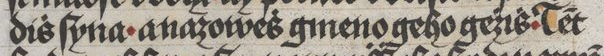diš ſyna.a nazoweš gmeno geho geżiṡ.Tēt
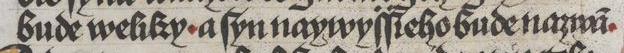bude weliky.a ſyn naywyẛẛieho bude nazwā.
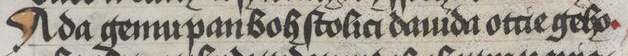A da gemu pan boh ſtolici dauida otcie geho.
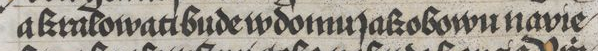a kralowati bude wdomu Iakobowu navie¬
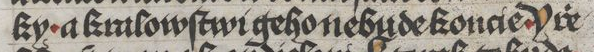ky.a kralowſtwí geho nebude koncie. Y ṙe¬
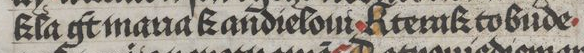kla ḡt maria andieloui.Kterak to bude.
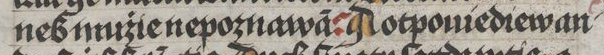neb mužie nepoznawá?A otpouiediew an¬
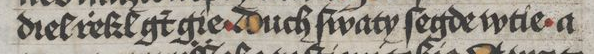diel ṙekl ḡt gíe.Duch ſwaty ſegde wtie.a
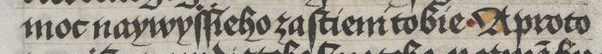moc naywyẛẛíeho zaſtieni tobie.A proto
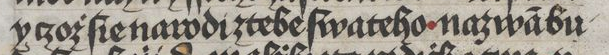y czoż ſie narodi ztebe ſwateho.nazwā bu¬
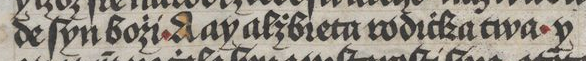de ſyn boži.A ay alžbieta rodiċka twa.y
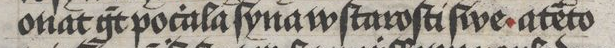onat ḡt poċala ſyna wſtaroſti ſwe.atēto
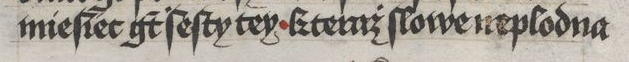mieſiec ḡt ẛeſty tey.kteráž ſlowe neplodna
